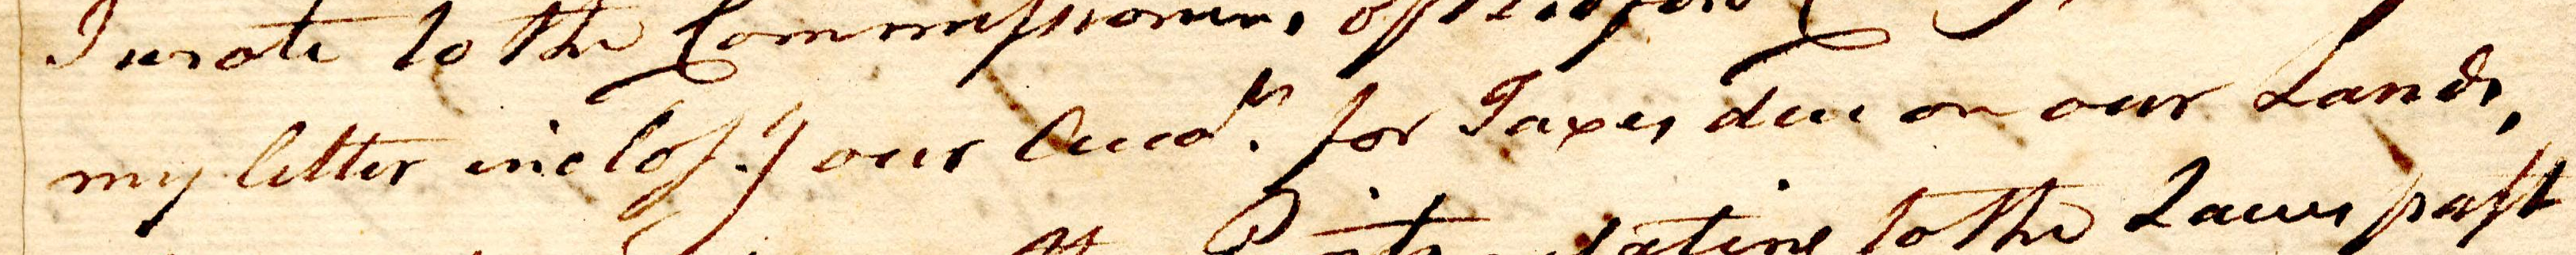my letter inclos^g our acco^ts. for taxes due on our Lands,
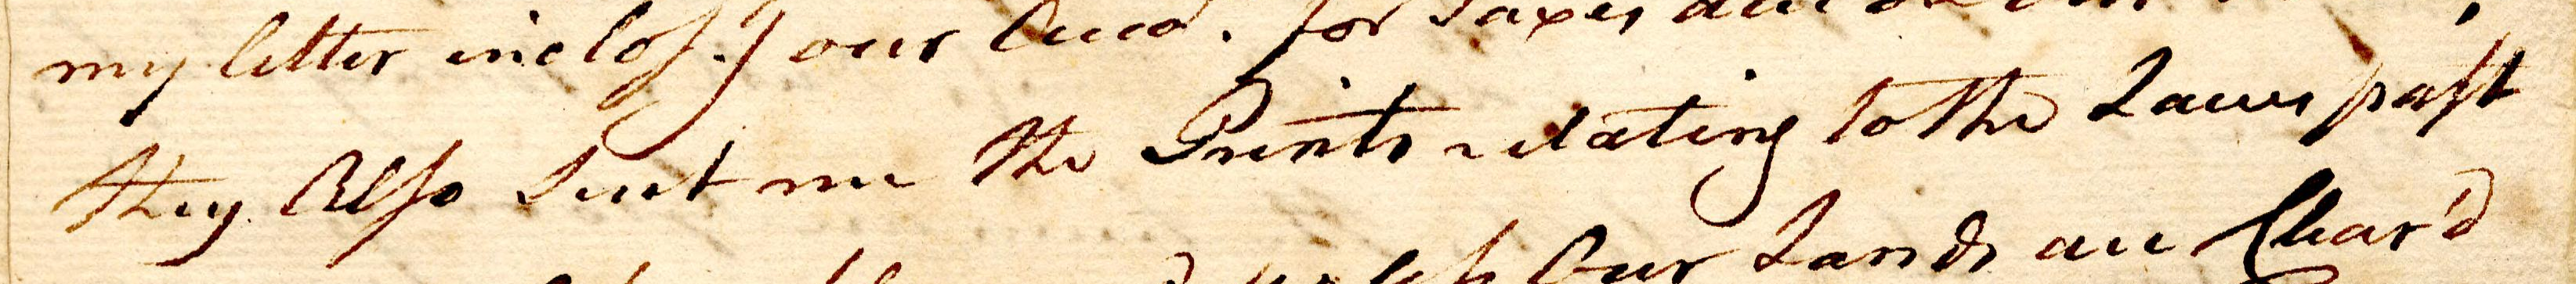they Also Sent me the Prints relating to the Laws past
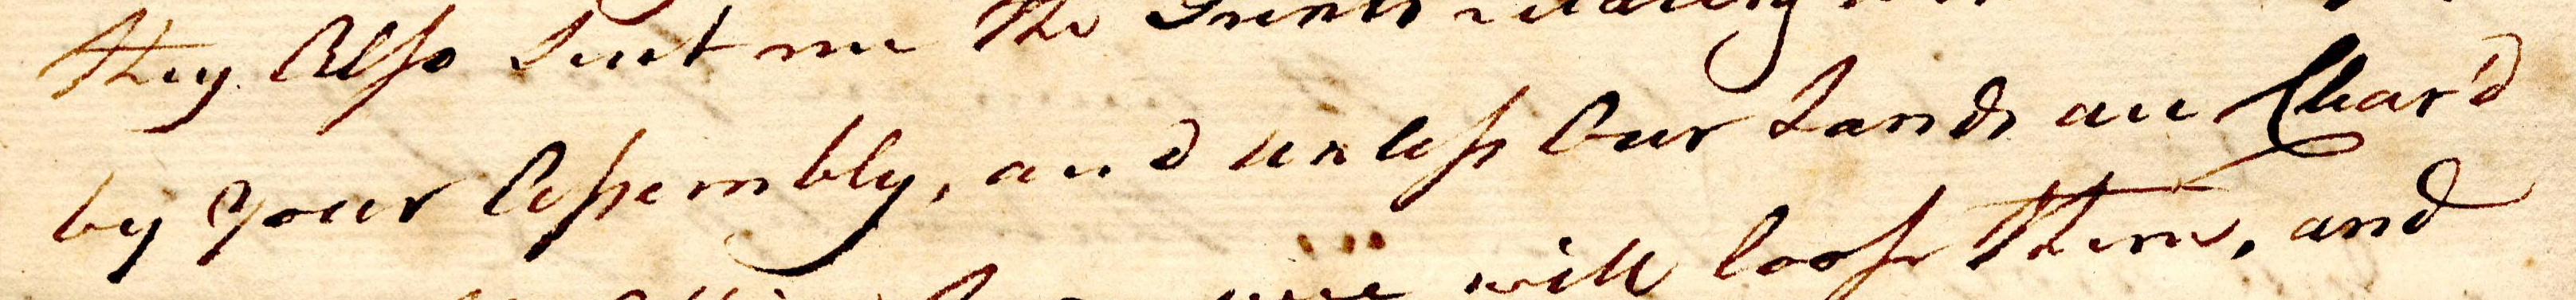by your assembly, and unless Our Iands are Clear'd
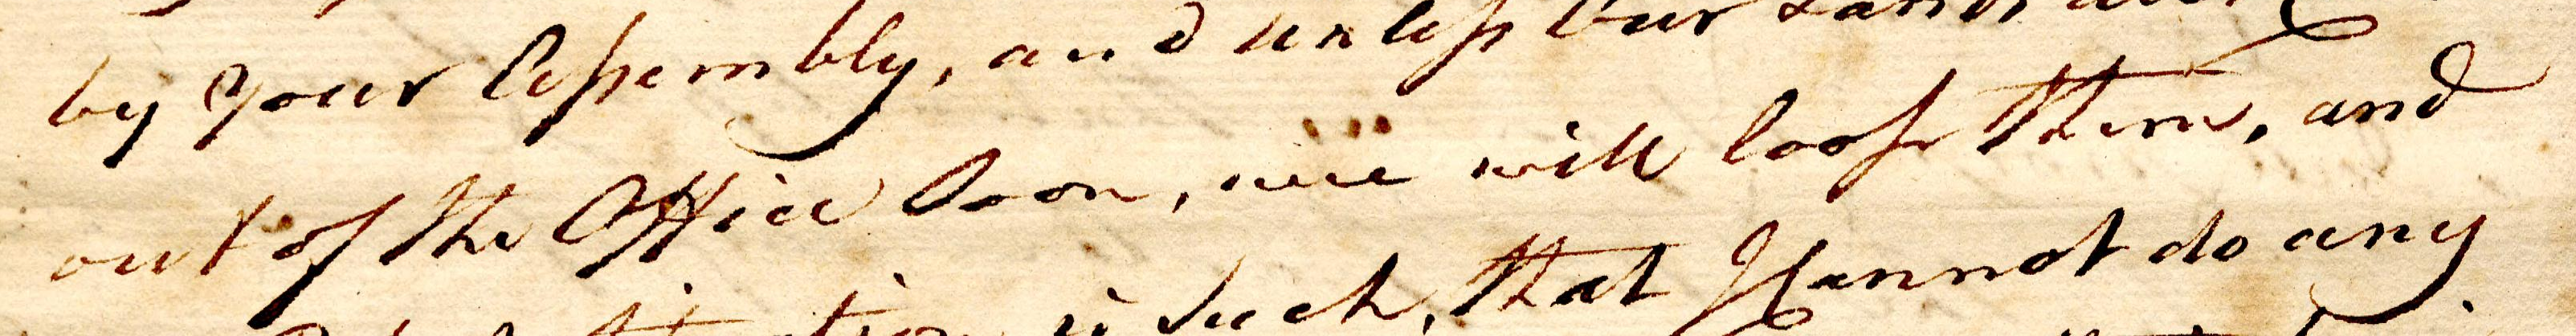out of the Office Soon, we will loose them, and
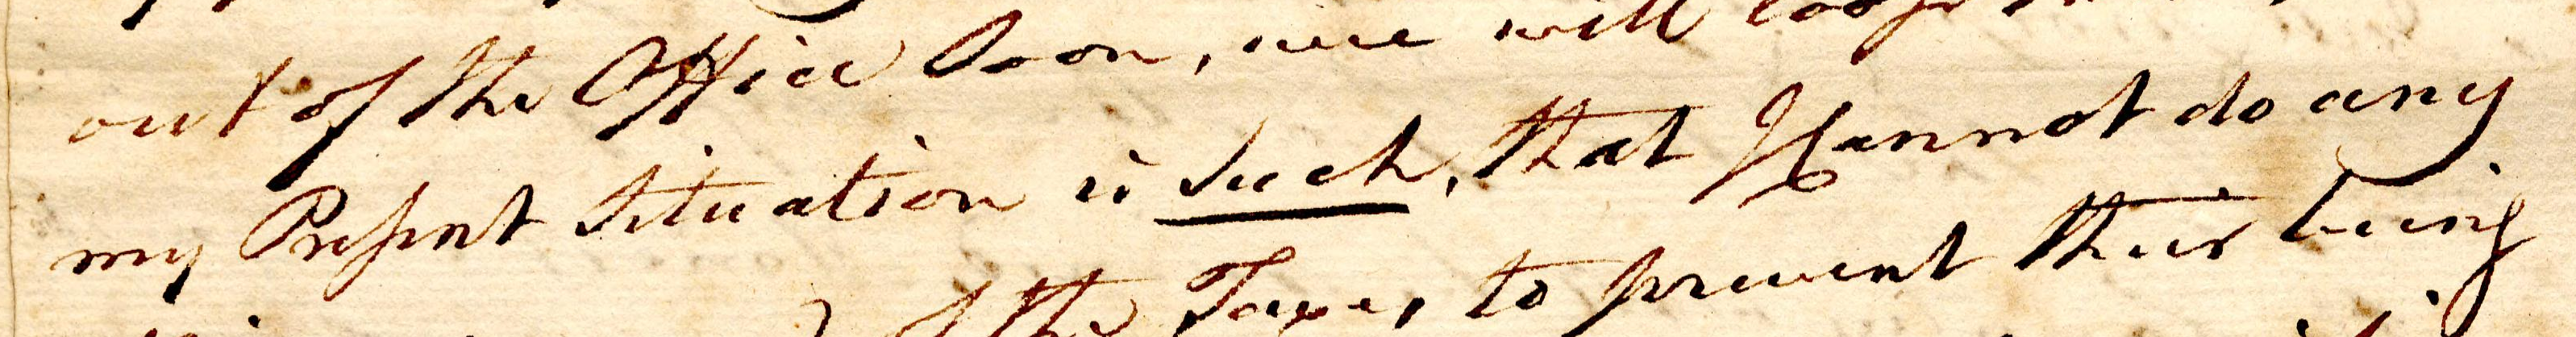my Present Situatson is such, that I cannot do any
